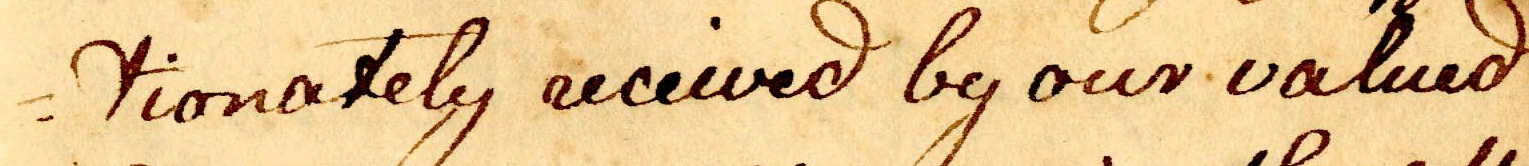-tionately received by our valued
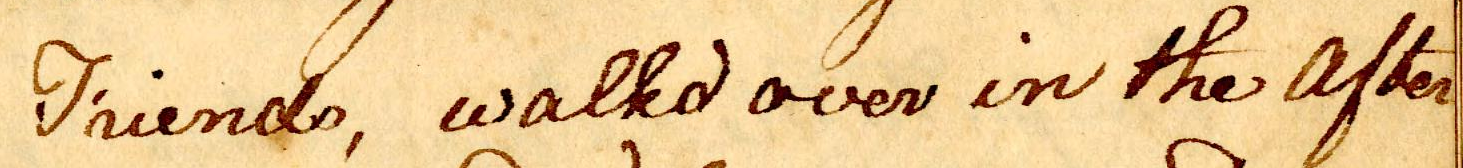Friends, walkd over in the after
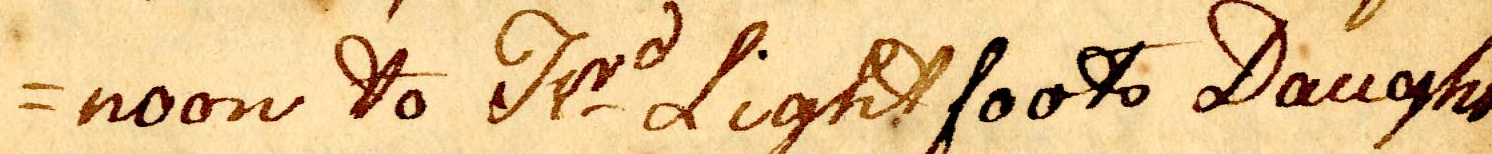-noon to F^rd Lightfoots Daugh
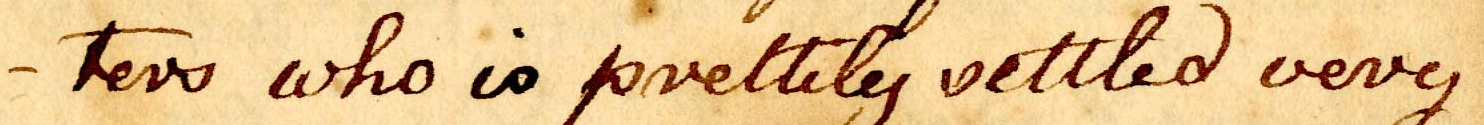-ters who is prettily settled very
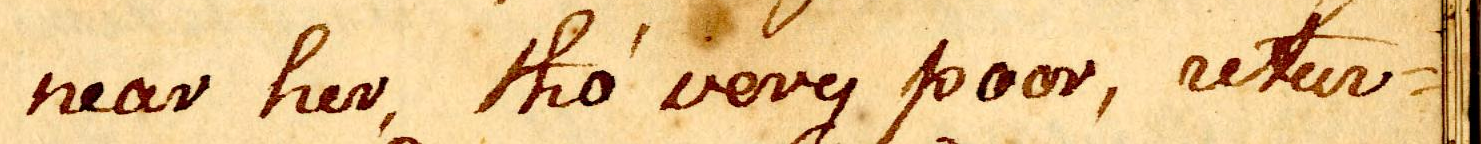near her, tho' very poor, retur-
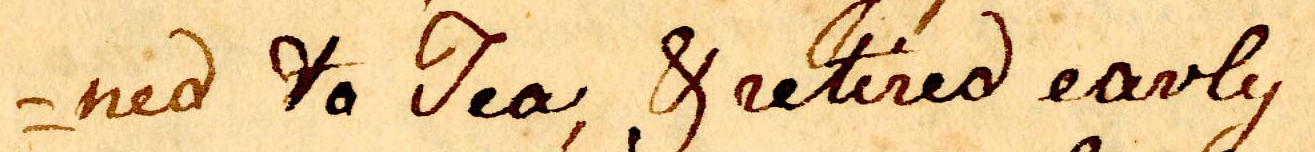-ned to Tea, & retired early
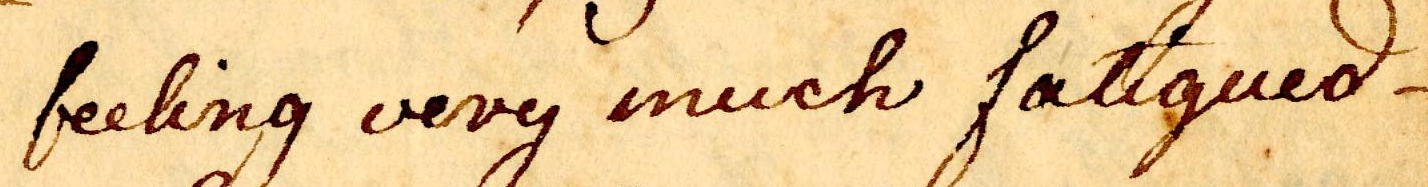feeling very much fatigued-
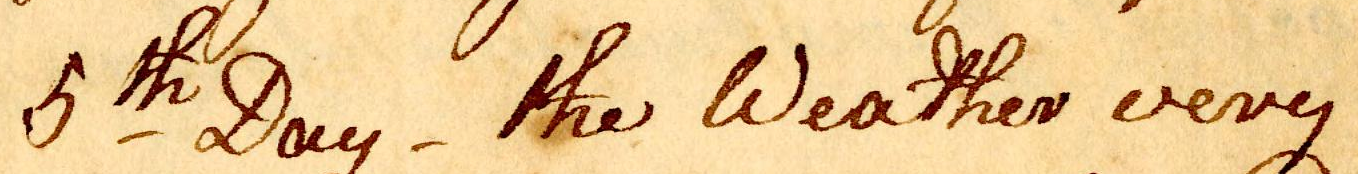5^th Day- the Weather very
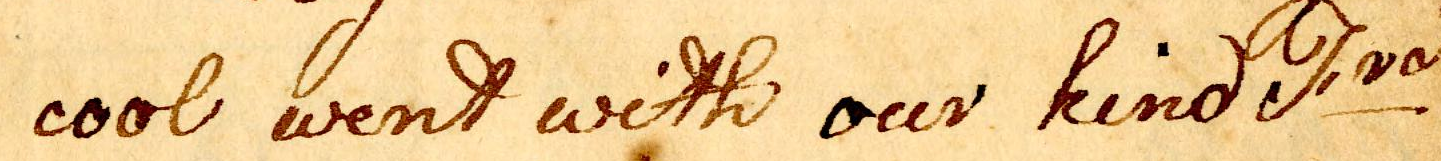cool went with our kind F^rd
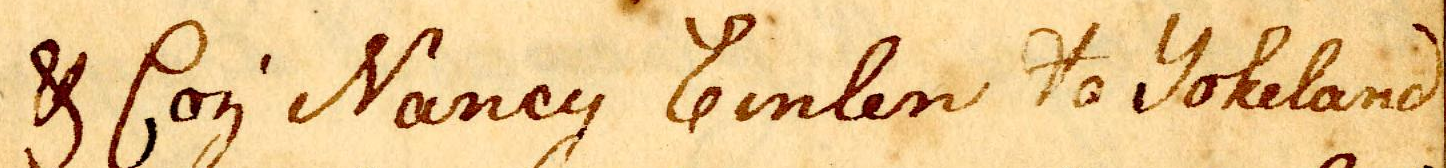& Coz' Nancy Emlen to Yokeland
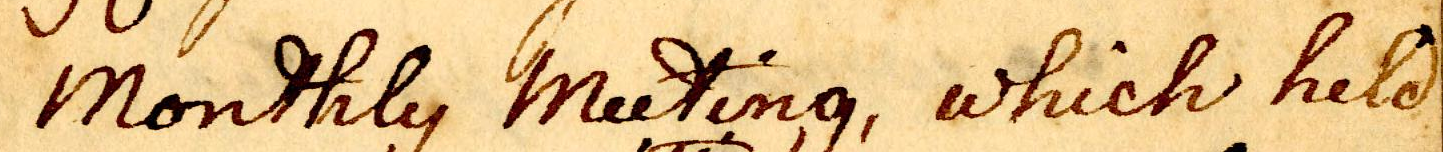Monthly Meeting, which held
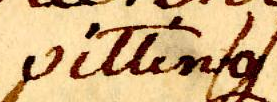sitting
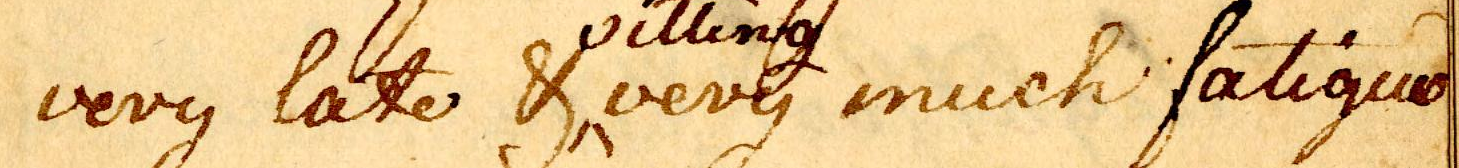very late & ^ very much fatigued
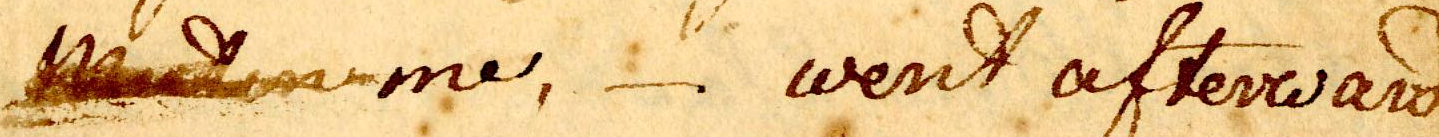[______] me,- went afterward
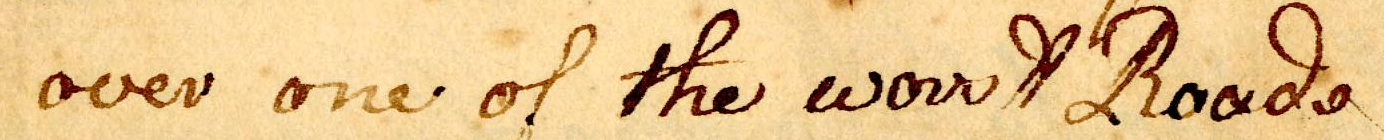over one of the worst Roads
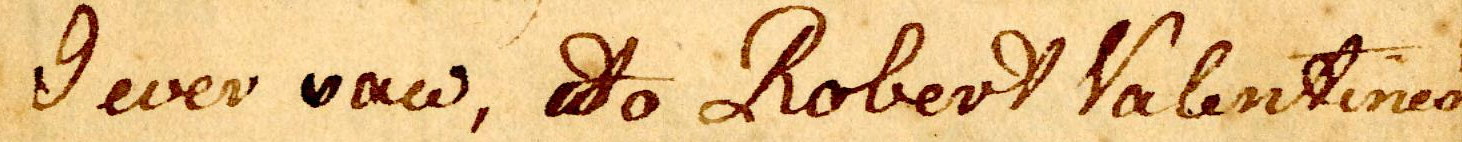I ever saw, to Robert Valentines
